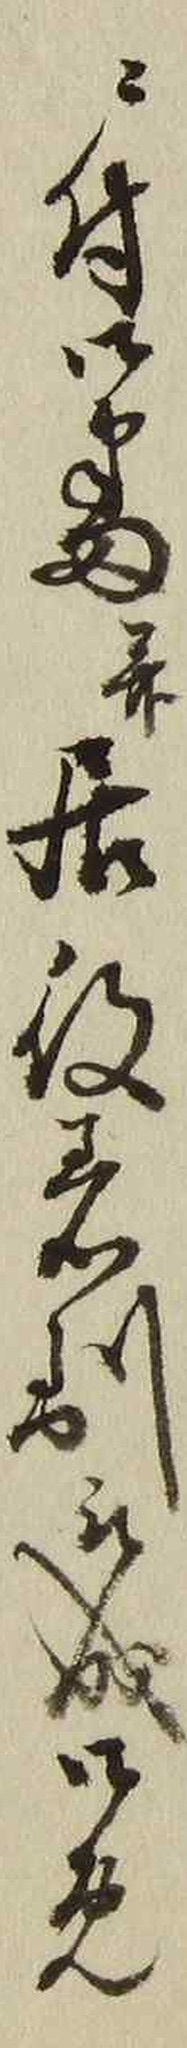ニ付御番并居役着判被成御免
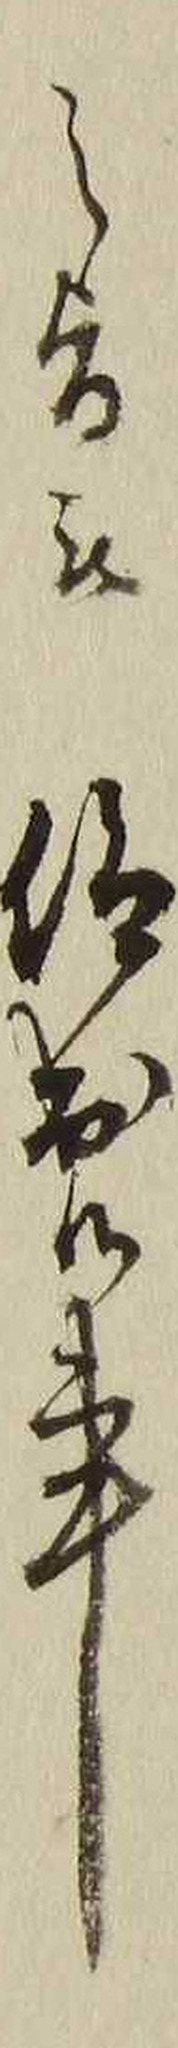之旨被仰出候事
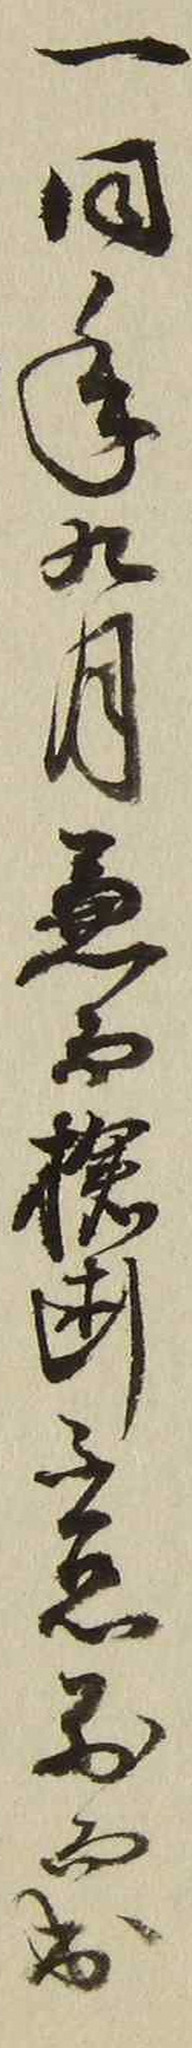一同年九月候兼而剣術不怠別而出
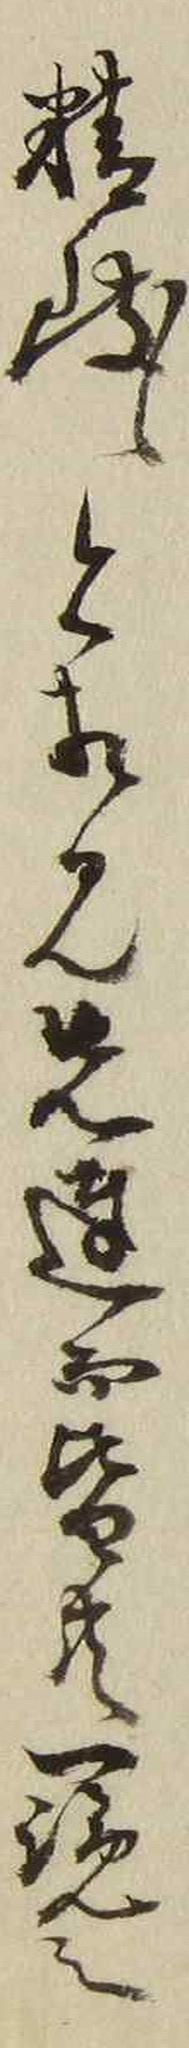精致候と相見先連而皆共一覧之

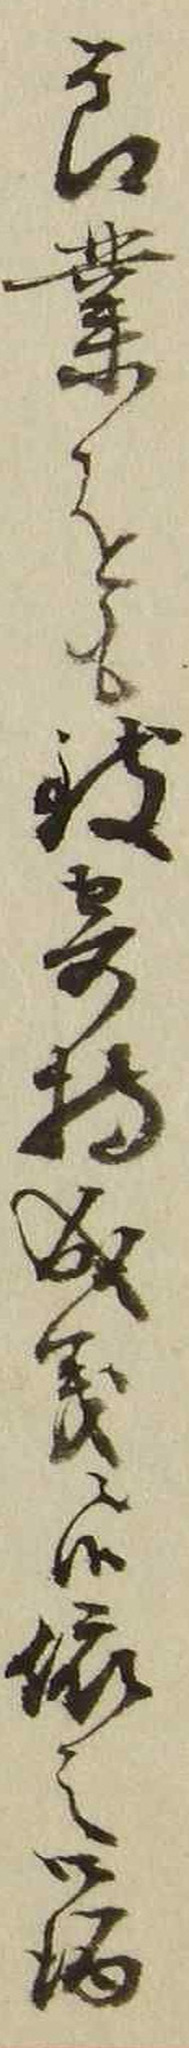節業をも致寄持成義ニ候依之御酒
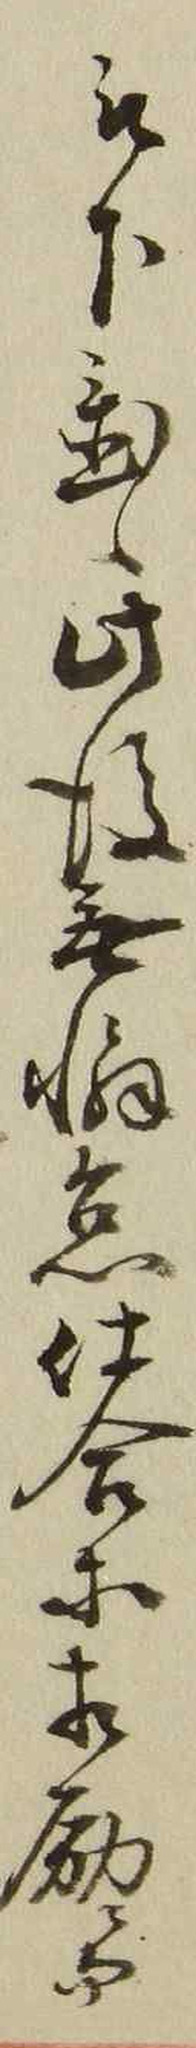被下置ゝ此後無懈怠仕合等相励ニ而
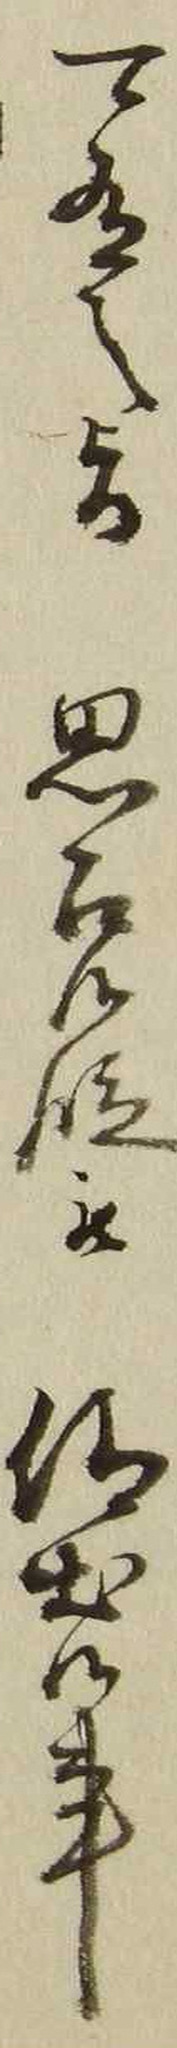可有之旨思召候段被仰出候事
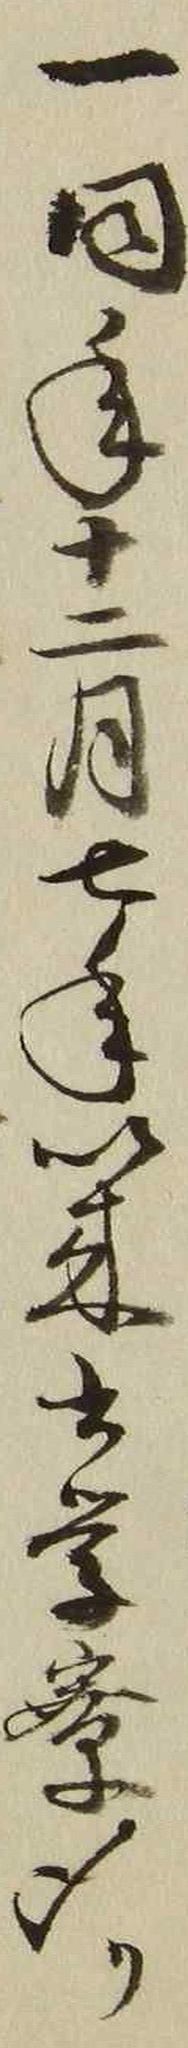一同年十二月七年以来書学寮〆り
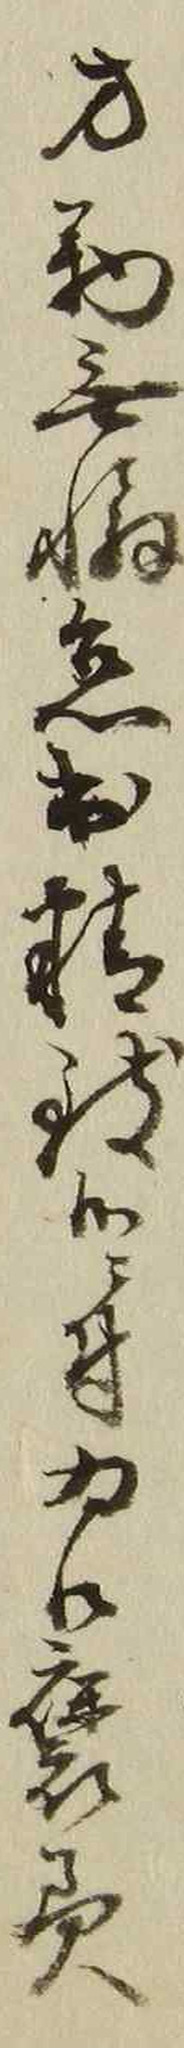方勤無懈怠出精致候ニ付為御褒美
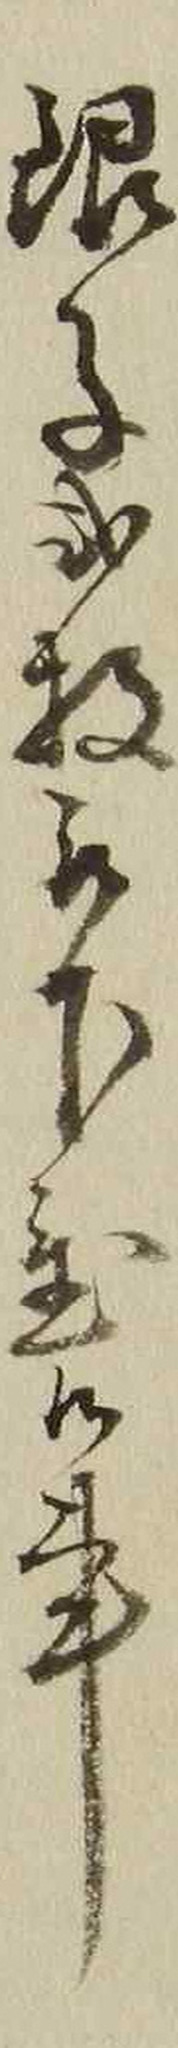銀子弐枚被下置候事
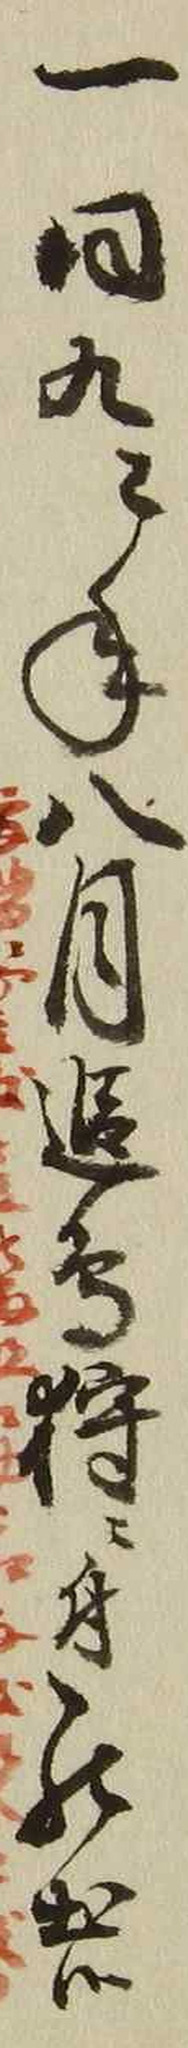一同九巳年八月追鳥狩ニ付罷出候
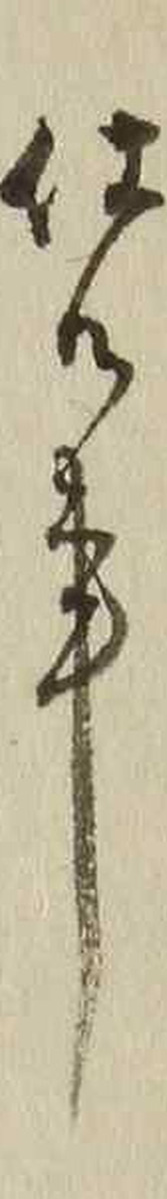仕候事
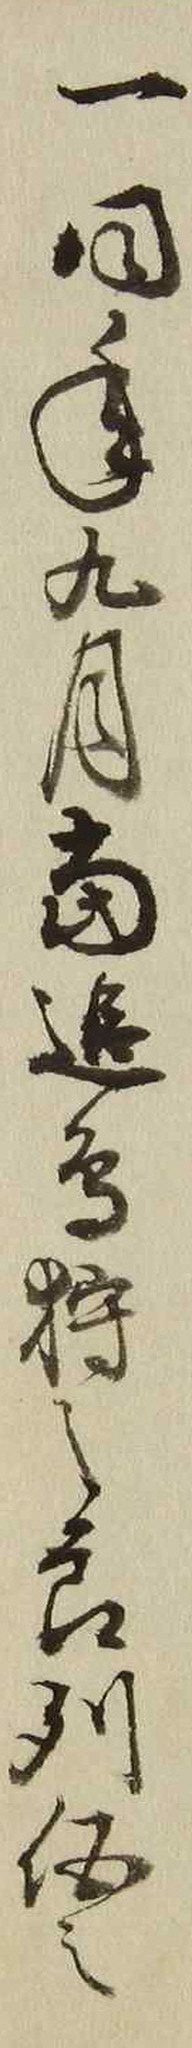一同年九月当追鳥狩之節列伍之
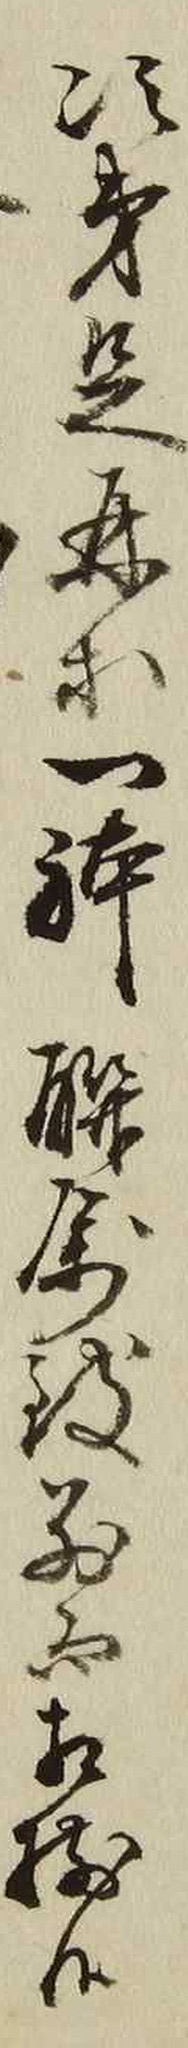次第足並等一体聯属致別而相揃候
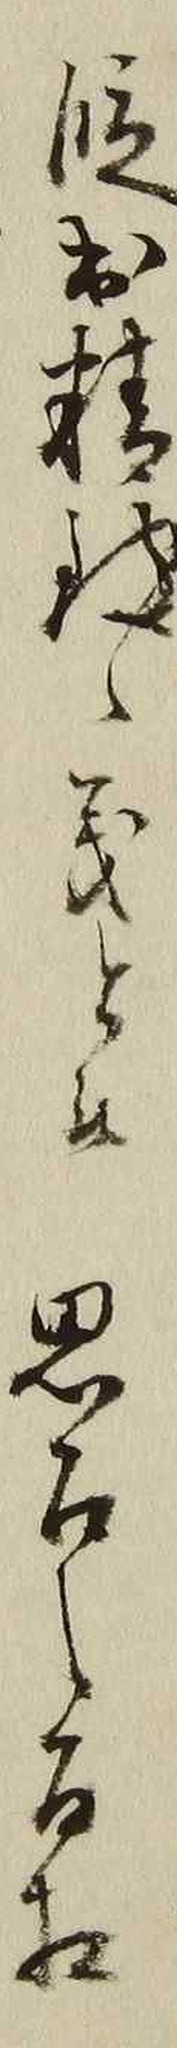段出精致候義と被思召之旨相
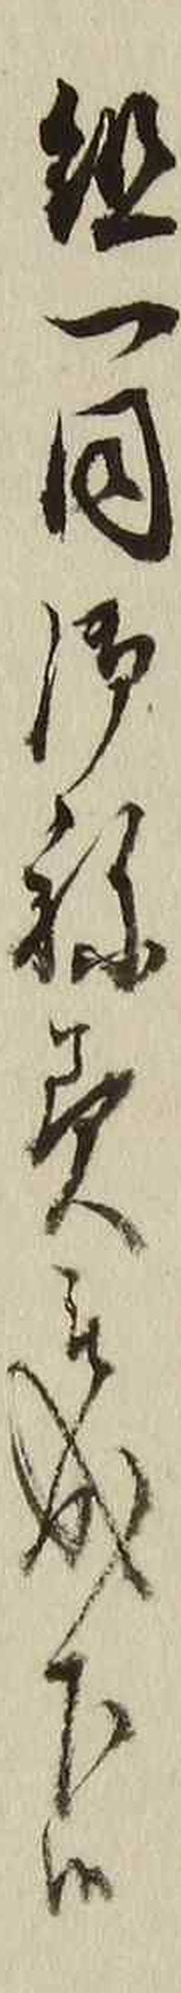組一同御称美被成下候
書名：諸士系譜　巻之36　は之部4
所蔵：会津若松市立会津図書館
